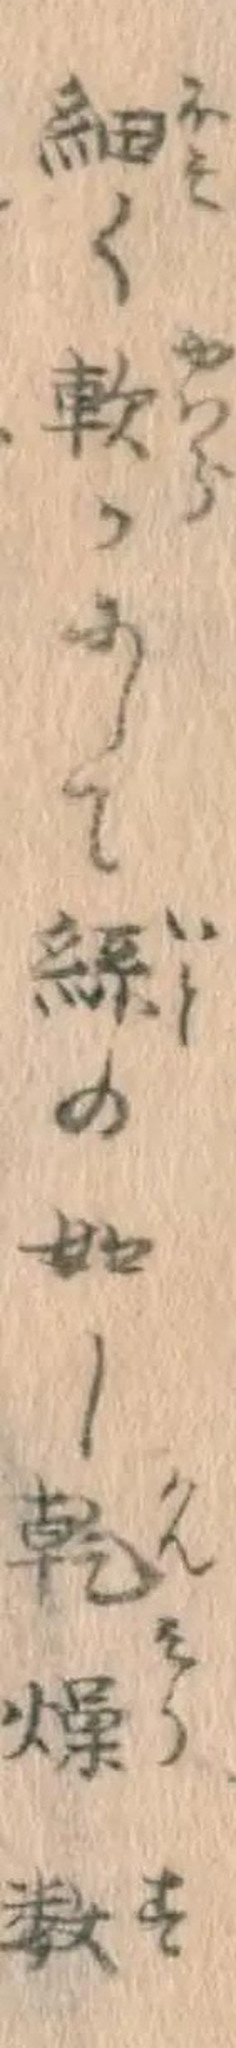細く軟かにして糸の如し乾燥数
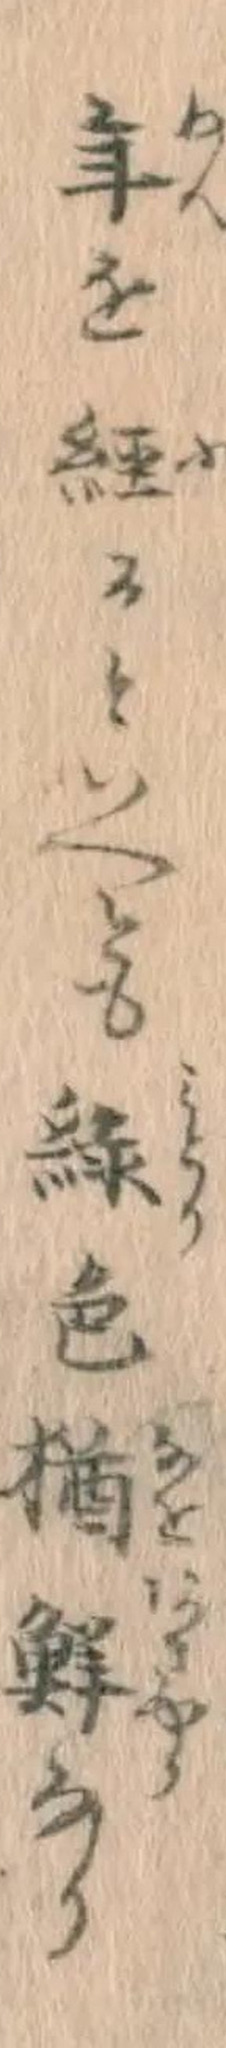年を経るといへとも緑色猶鮮なり
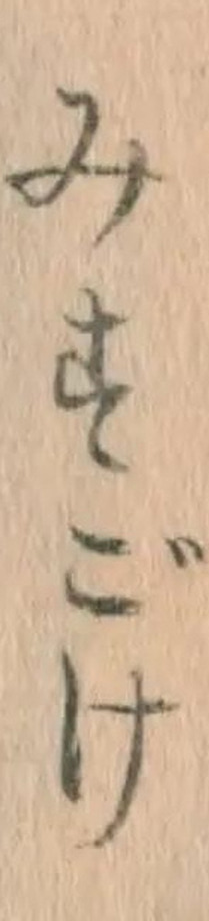みすごけ
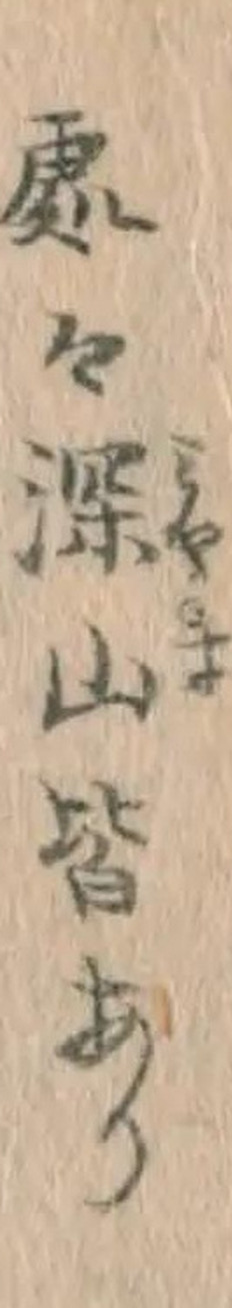処々深山皆あり
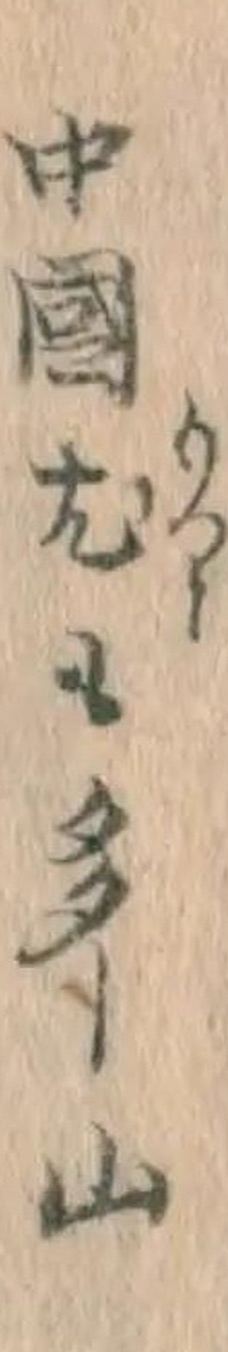中国尤も多し山
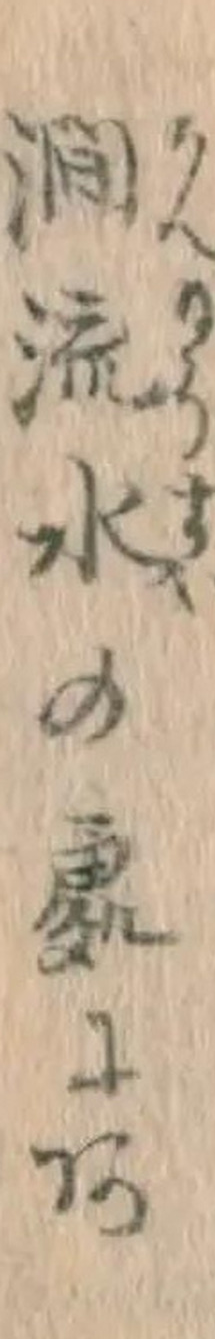澗流水の処にあ
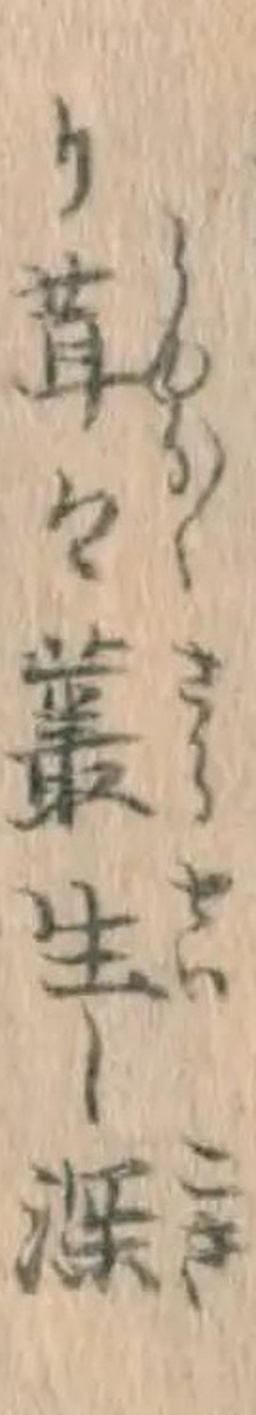り茸々叢生し深
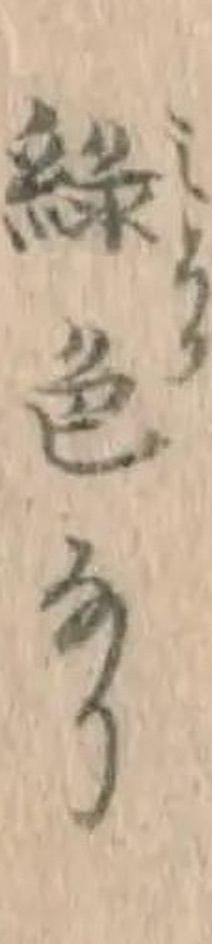緑色なり

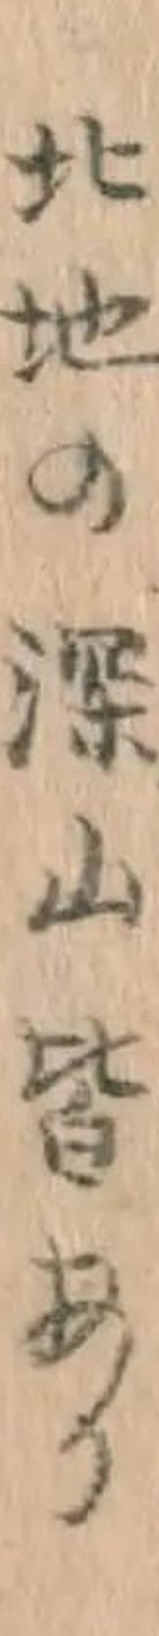北地の深山皆あり
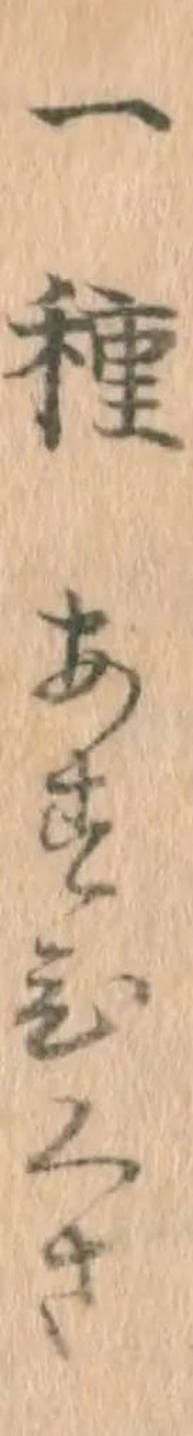一種あすひくさ
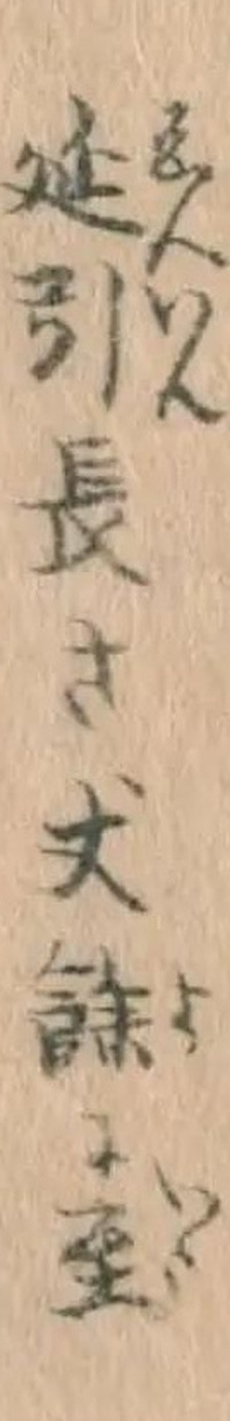延引長さ丈余に至
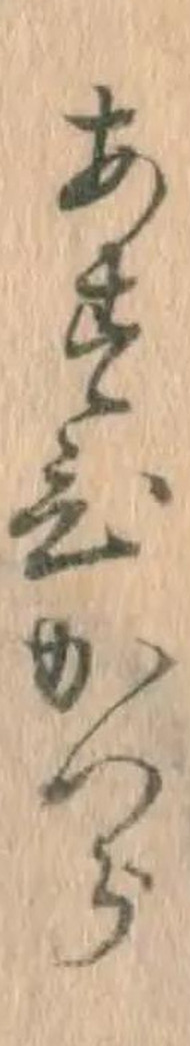あすひかつら
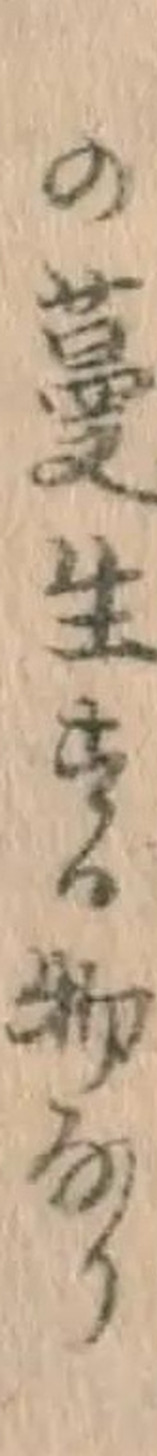の蔓生する物なり
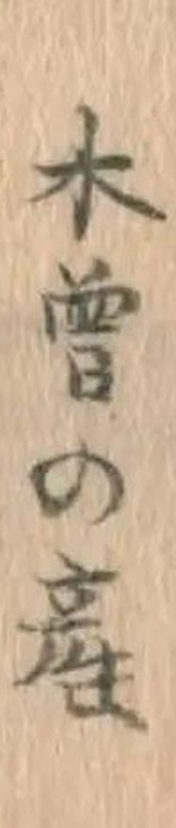木曽の産
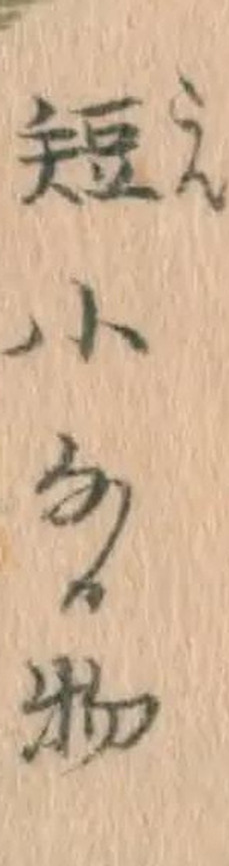短小なる物

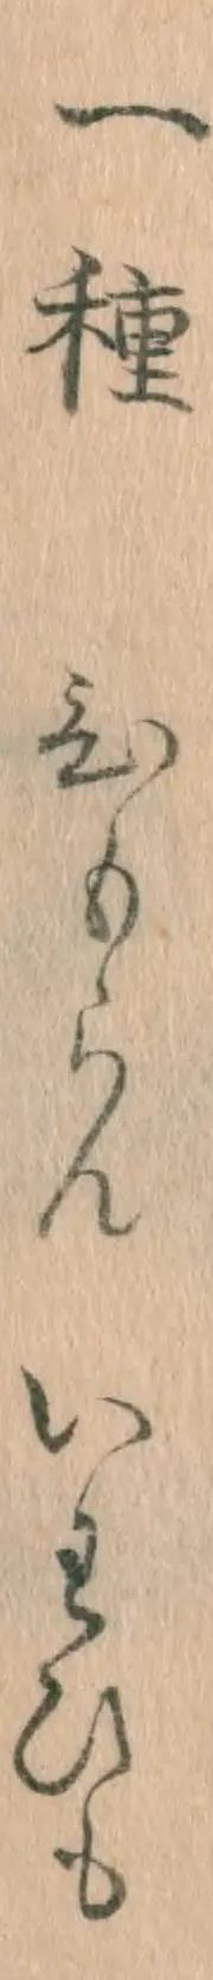一種ひもらんいわひも
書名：本草図譜. 巻37-39
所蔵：国立国会図書館 National Diet Library, JAPAN
